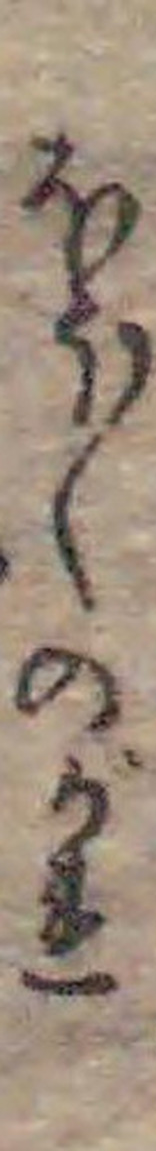ほう〳〵のがれ
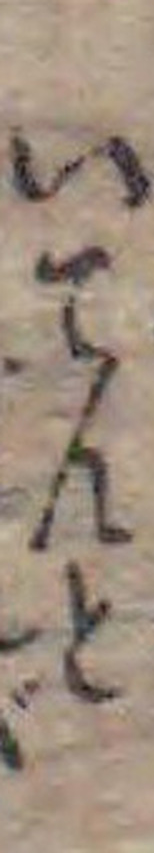いてんと
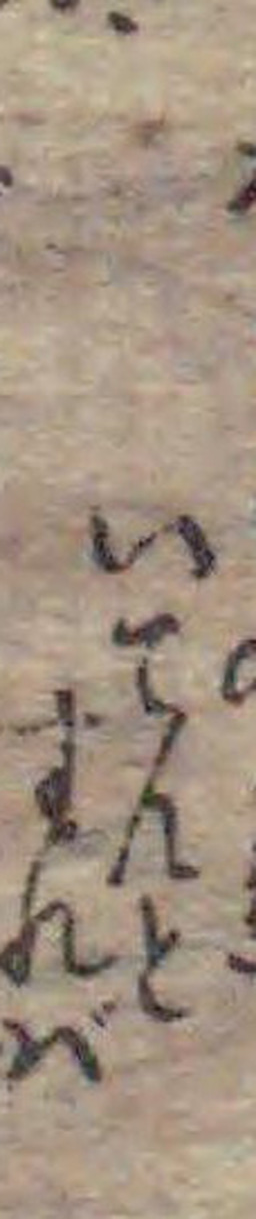すれば
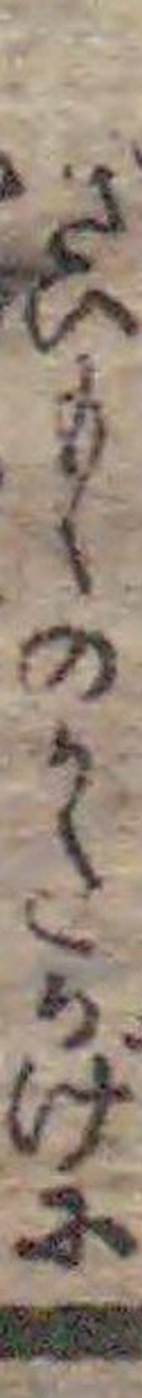ざいもくのかたかげに
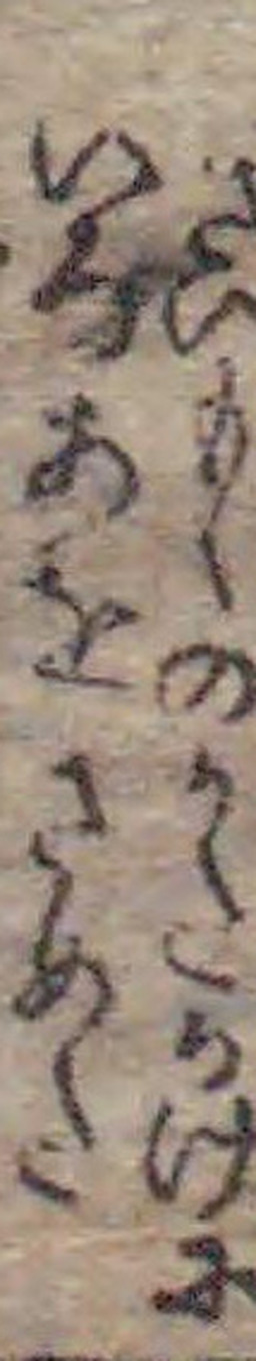いろあをさめた
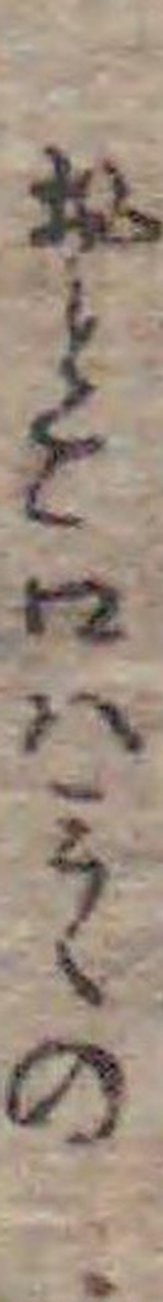おとこ口はみゝの
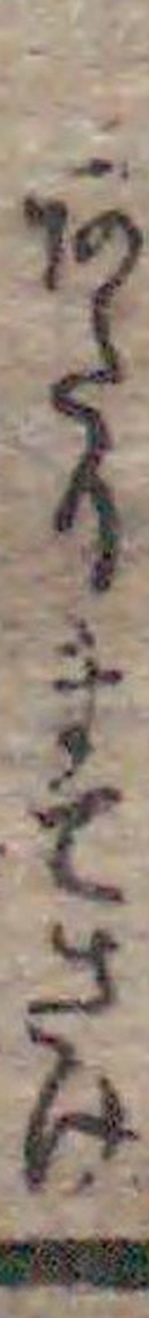あたりまてさけて
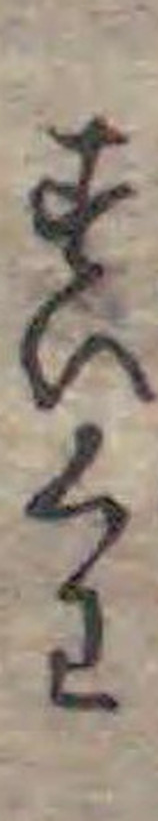すいくわ
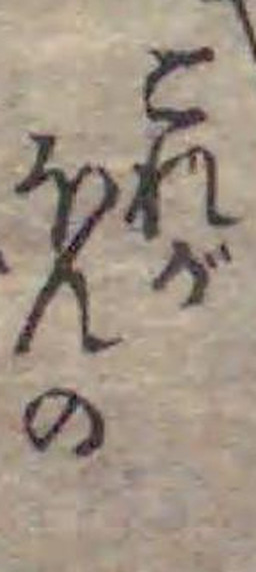ほんの
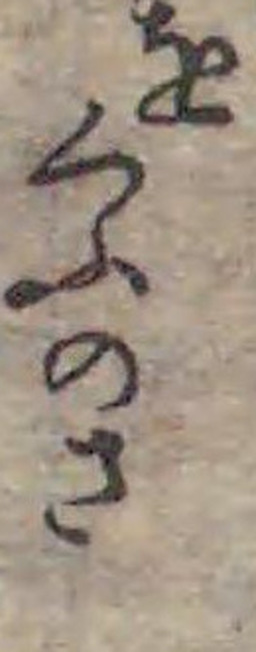くふのさ
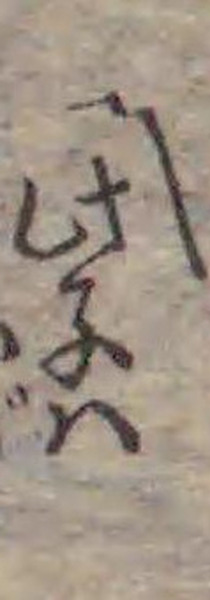〽此子は
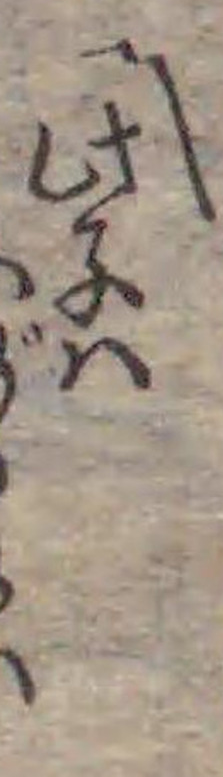〽此子は
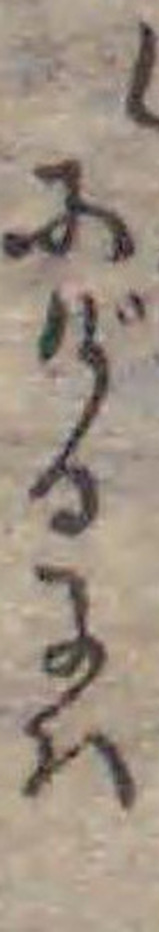にげるには
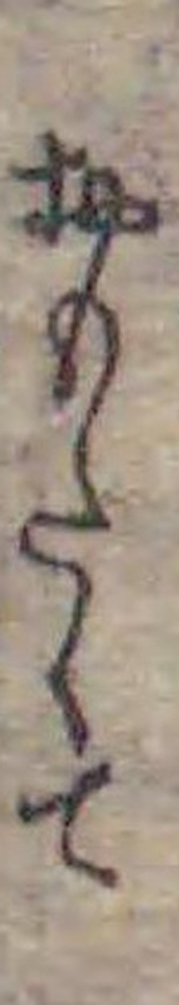おもたくて
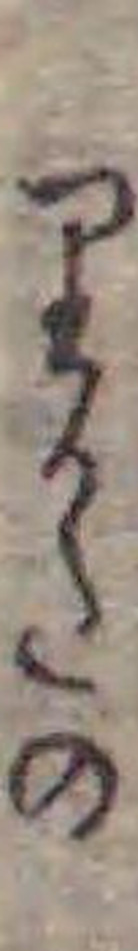りかたの
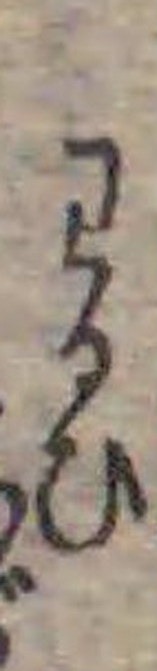わるひ
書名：怪物つれつれ草 : 2巻
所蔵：国立国会図書館 National Diet Library, JAPAN
